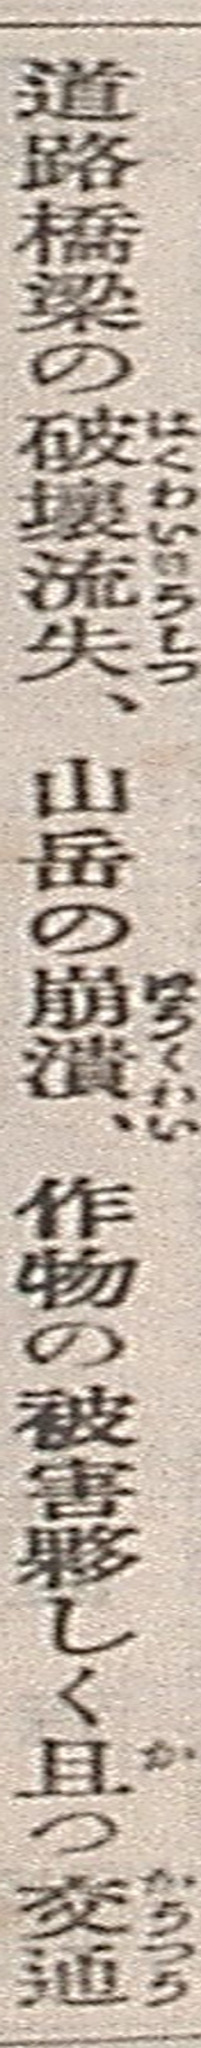道路橋梁の破壊流失、山岳の崩潰、作物の被害夥しく且つ交通
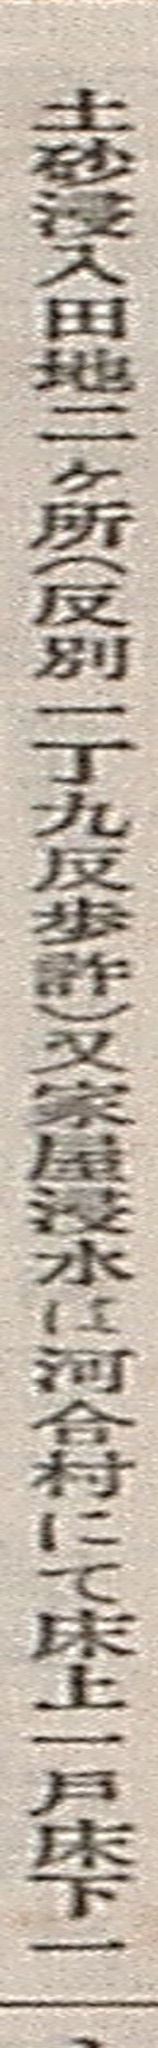土砂侵入田地二ヶ所又家屋浸水は河合村にて床上一尺床下一
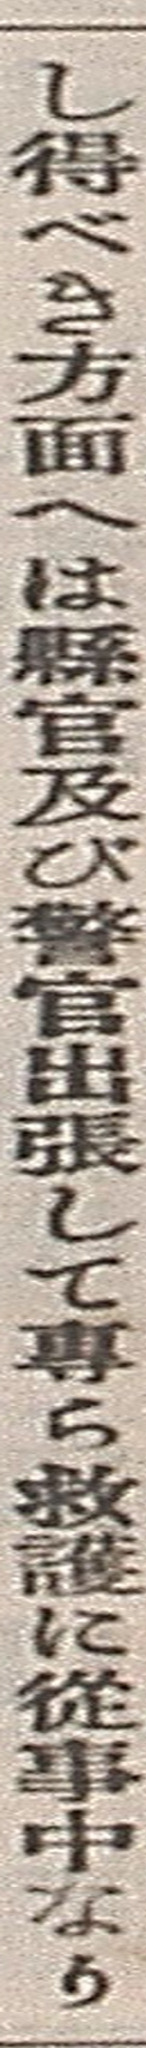し得べき方面へは県官及び警官出張して専ら救護に従事中なり
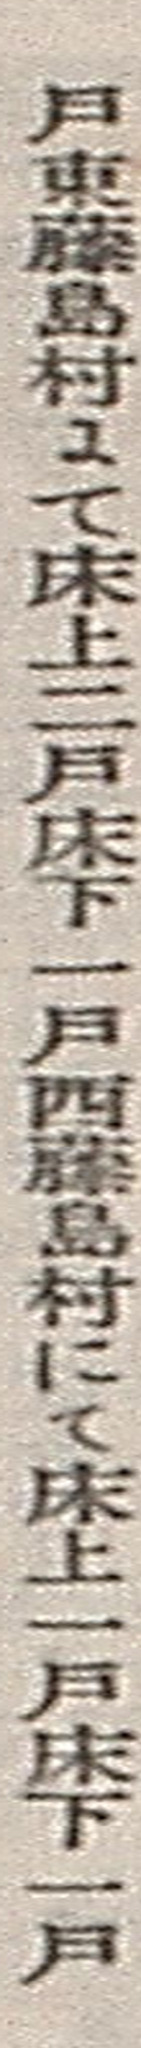戸東藤島村にて床上二戸床下一戸西藤島村にて床上一戸床下一戸
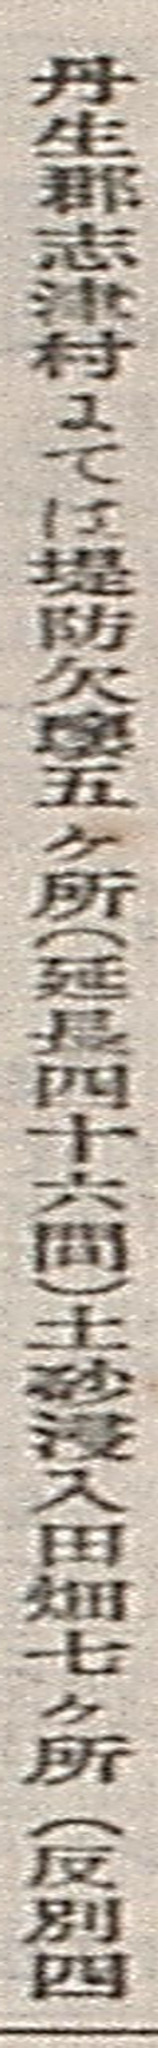丹生郡志津村にては堤防欠壊五ヶ所土砂侵入田畑七ヶ所（反別四
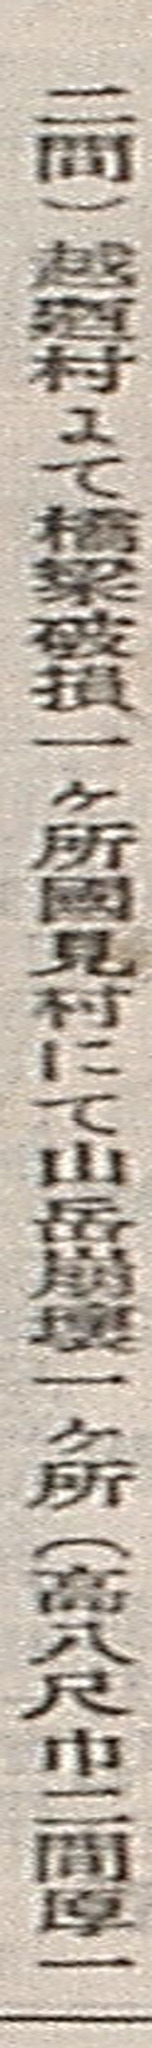二間）越廻村にて橋梁破損一ヶ所国見村にて山岳崩壊一ヶ所（高八尺巾二間厚一
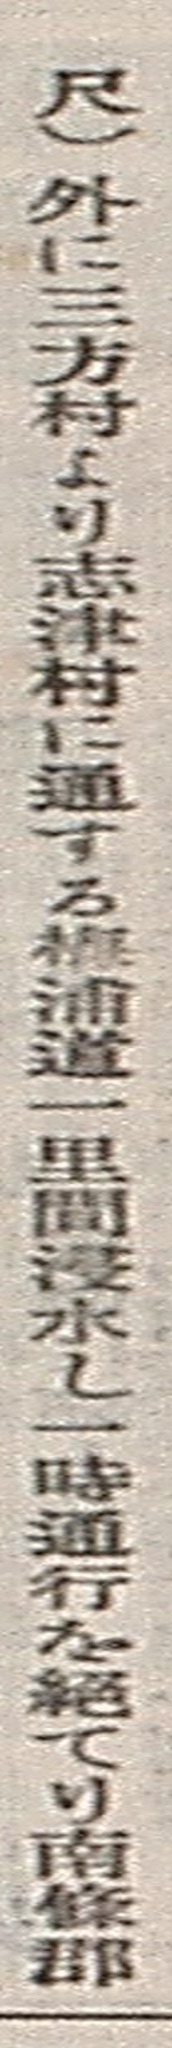尺）外に三方村より志津村に通する梅浦道一里間浸水し一時通行を絶てり南條郡
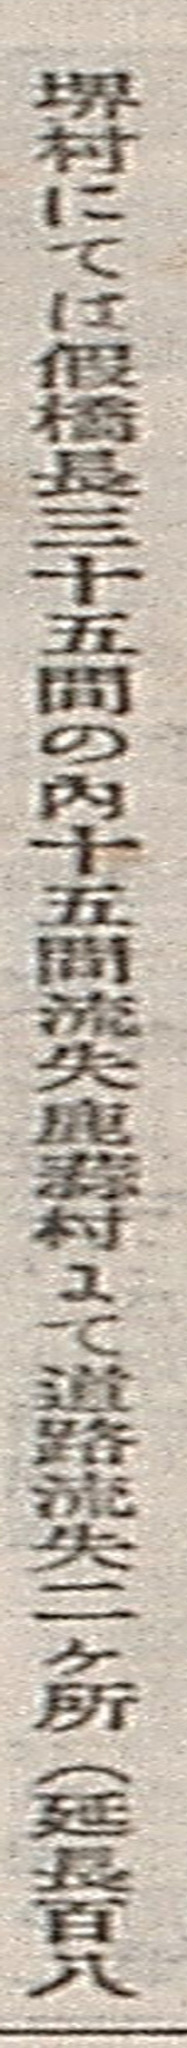堺村にては假橋長三十五間の内十五間流失鹿蒜村にて道路流失二ヶ所（延長百八
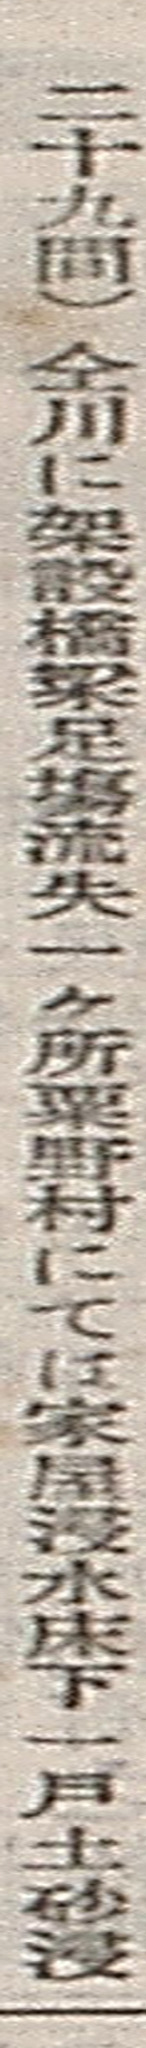二十九間）同川に架設橋梁足場流失一ヶ所粟野村にては家屋浸水床下一戸土砂浸
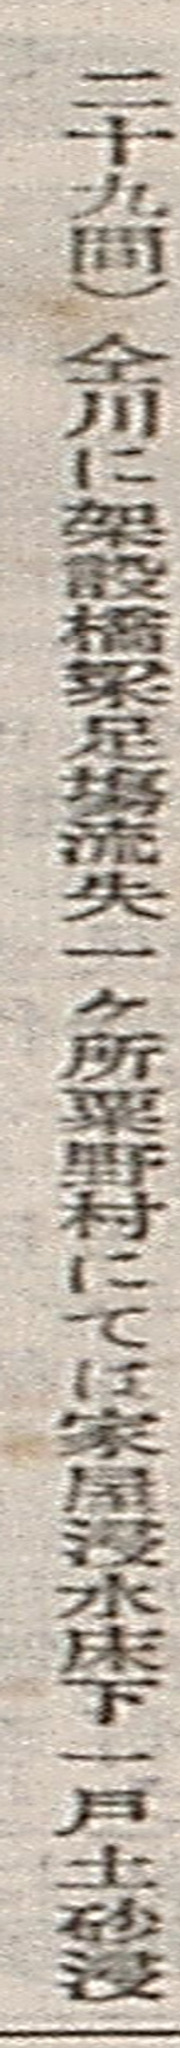二十九間）同川に架設橋梁足場流失一ヶ所粟野村にては家屋浸水床下一戸土砂浸
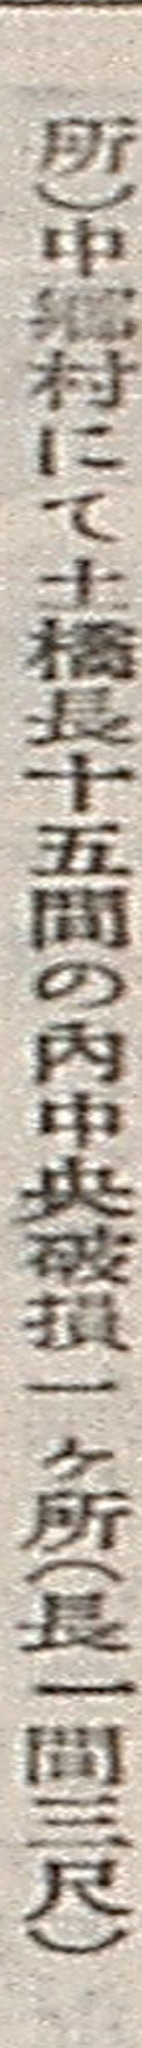所）中郷村にて土橋長十五間の内中央破損一ヶ所
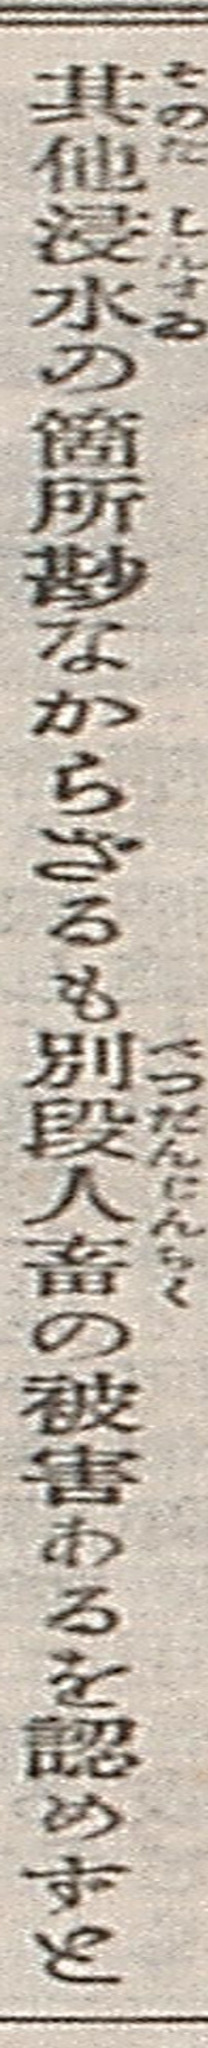其他合浸水の箇所尠なからざるの別段人畜の被害あるを認めずと
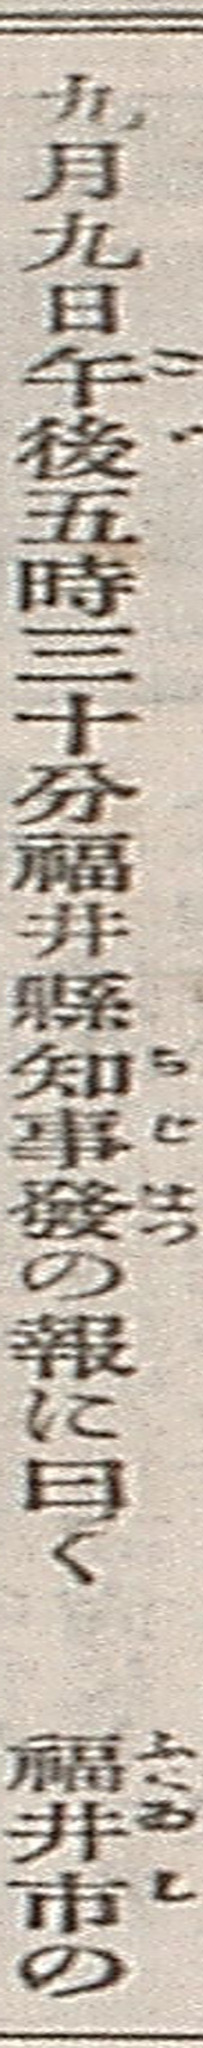九月九日午後五時三十分福井県知事発の報に曰く福井市の
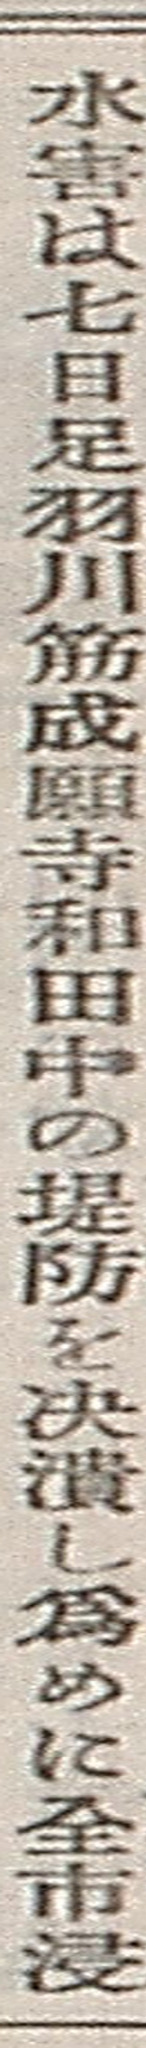水害は七日足羽川筋成願寺和田中の堤防を决潰し為めに全市浸
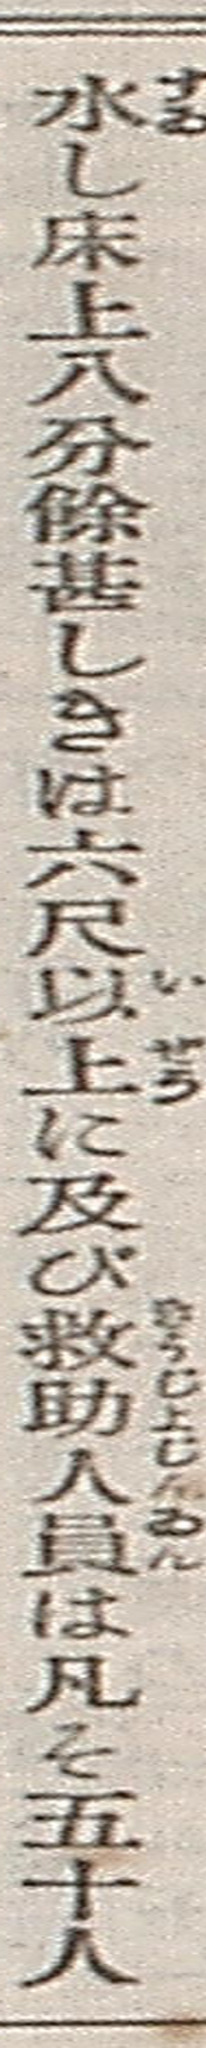水し床上八分餘甚しきは六尺以上に及び救助人員は凡そ五十人
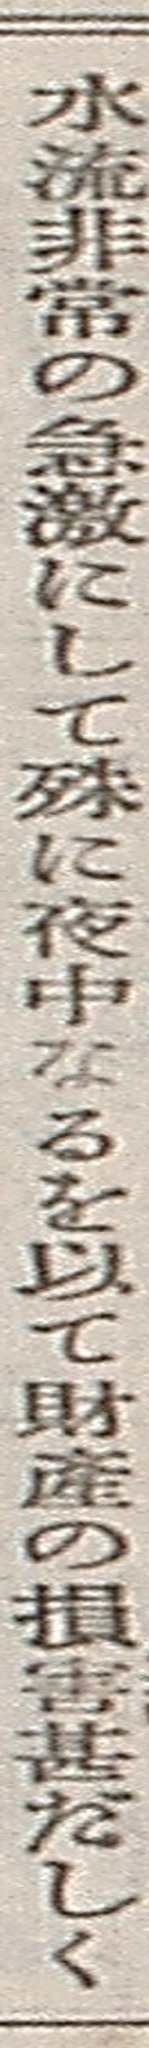水流非常の急激にして殊に夜中なるを以て財産の損害甚だしく
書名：風俗畫報臨時増刊第百二十八號　洪水被害録（下）
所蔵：東京大学地震研究所図書室 Earthquake Research Institute Library, The University of Tokyo, JAPAN
